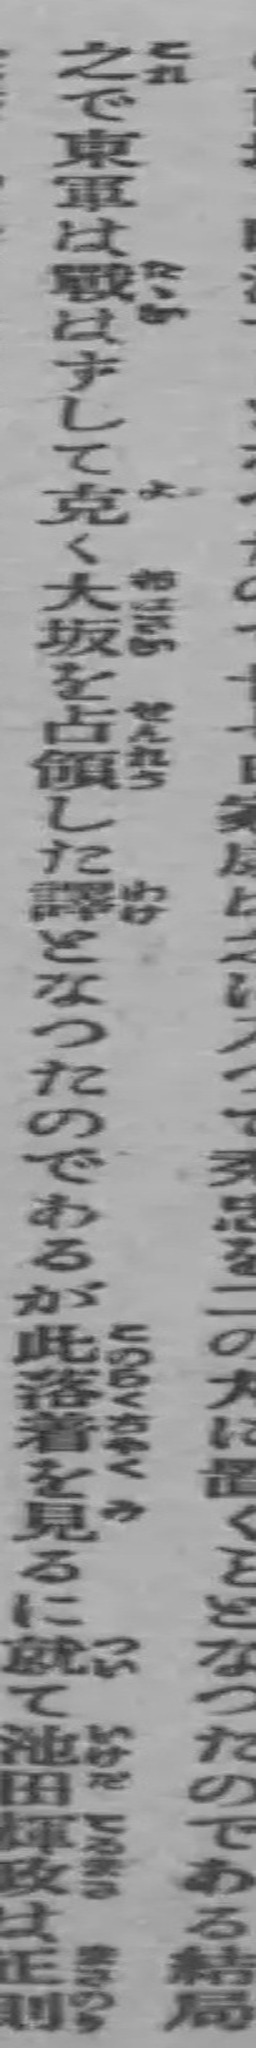之で東軍は戦はずして克く大坂を占領した訳となつたのであるが此落着を見るに就て池田輝政は正則
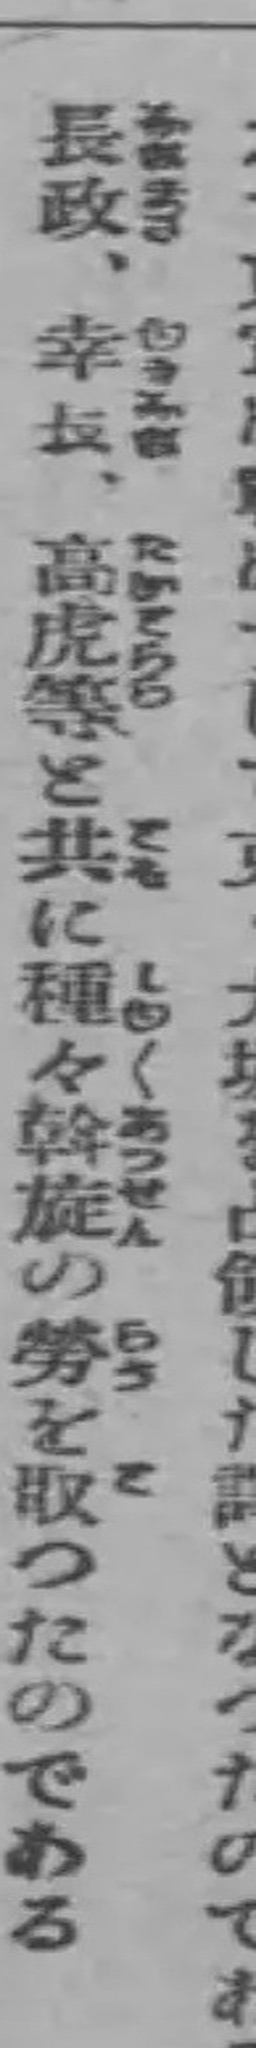長政、幸長、高虎等と共に種々斡旋の労を取つたのである
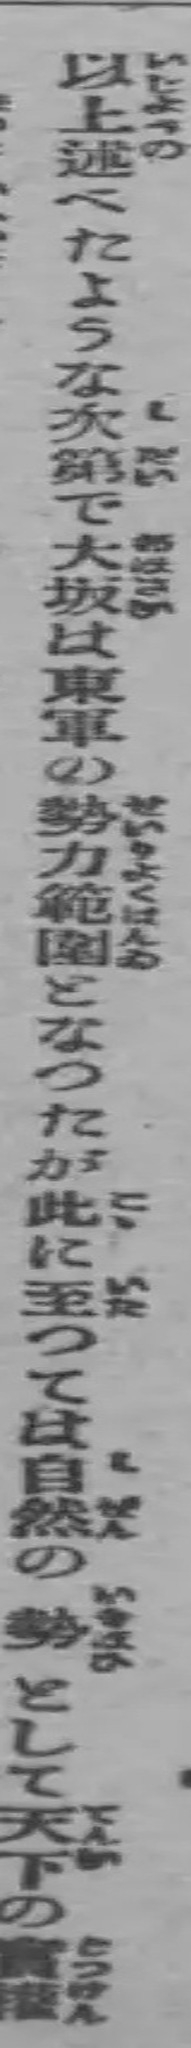以上述べたような次第で大坂は東軍の勢力範囲となつたが此に至つては自然の勢として天下の実権
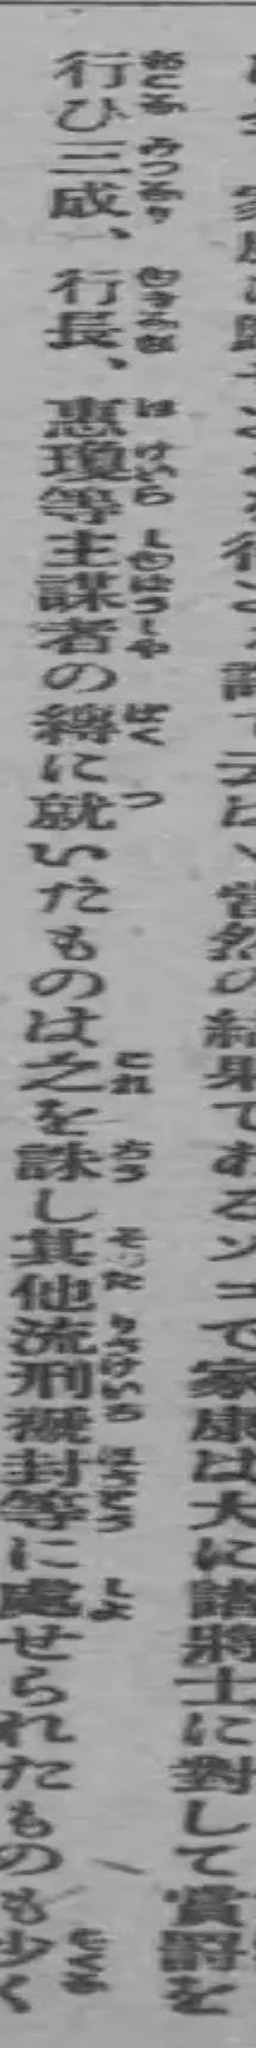行ひ三成、行長、恵瓊等主謀者の縛に就いたものは之を誅し其他流刑褫封等に処せられたものも少く
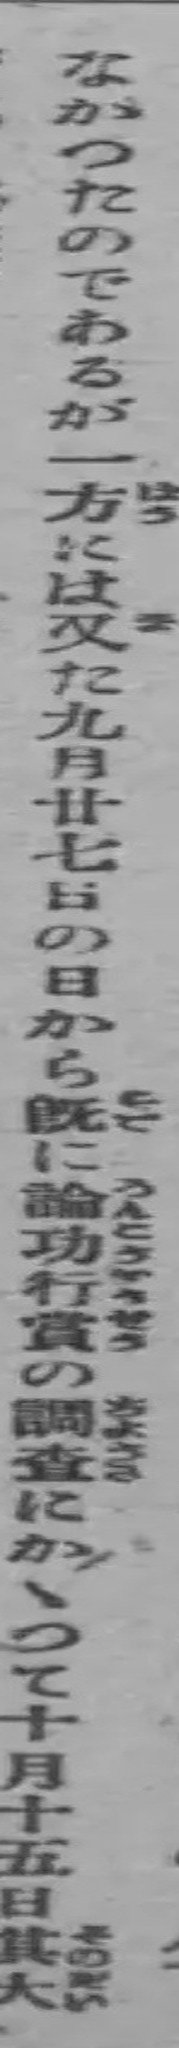なかつたのであるが一方には又た九月廿七日の日から既に論功行賞の調査にかゝつて十月十五日其大
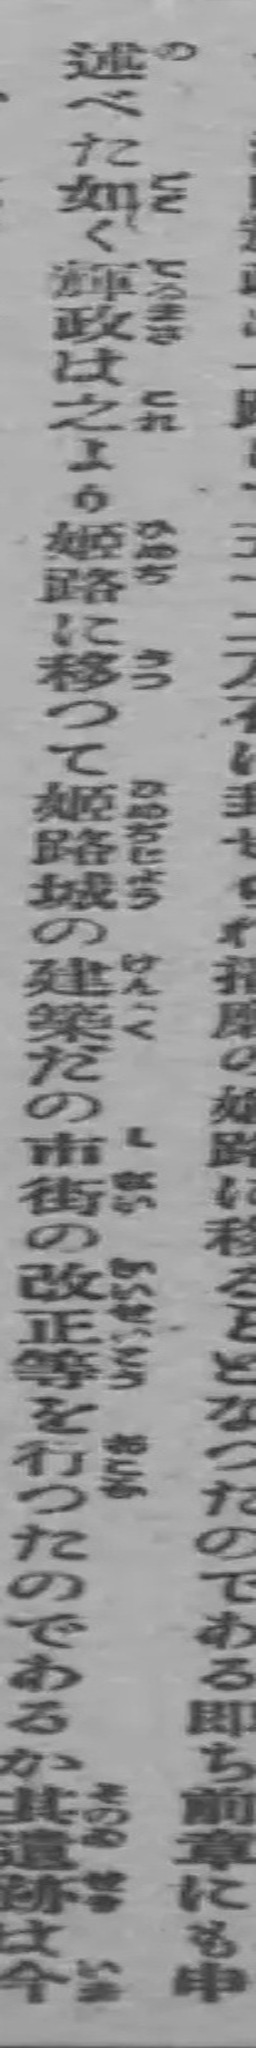述べた如く輝政は之より姫路に移つて姫路城の建築だの市街の改正等を行つたのであるか其遺跡は今
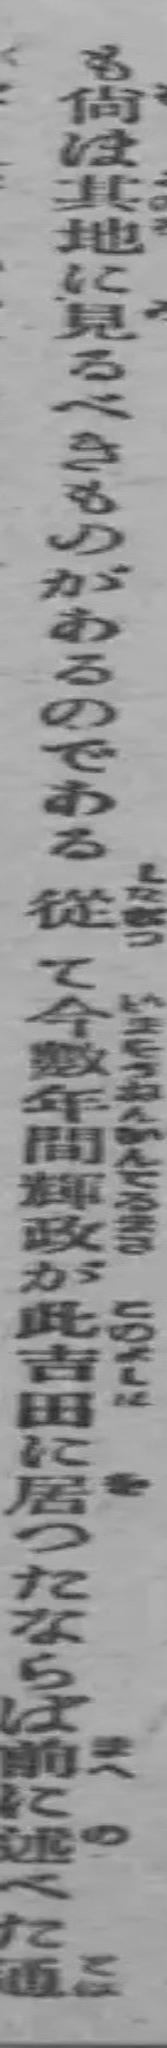も尚ほ其地に見るべきものがあるのである従て今数年間輝政が此吉田に居つたならば前に述べた通
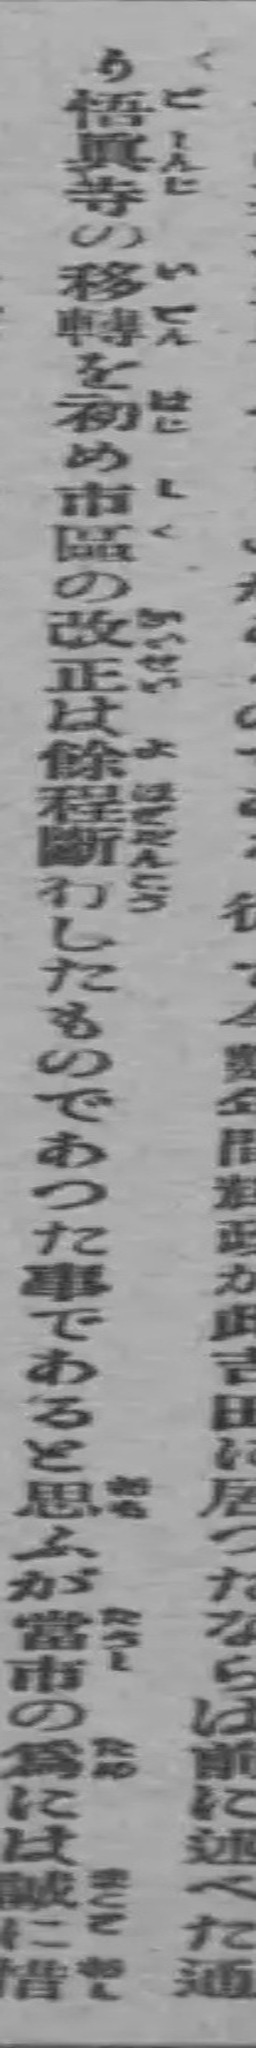り悟真寺の移転を初め市区の改正は余程断行したものであつた事であると思ふが当市の為には誠に惜
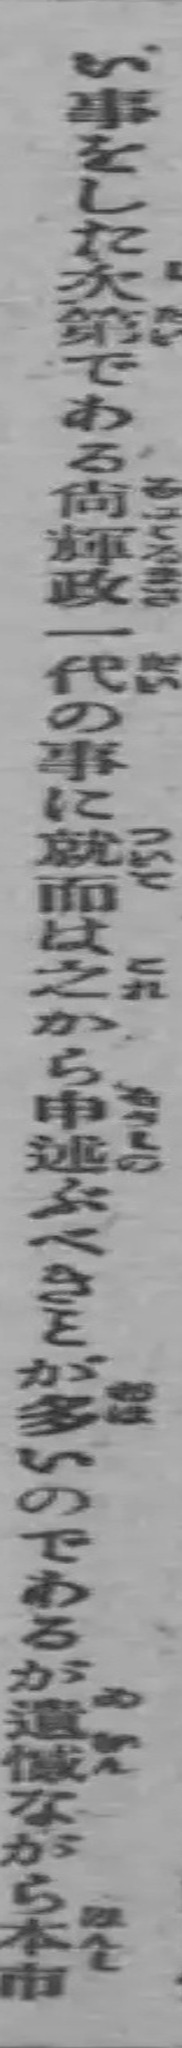い事をした次第である尚輝政一代の事に就而は之から申述ぶべきことが多いのであるが遺憾ながら本市
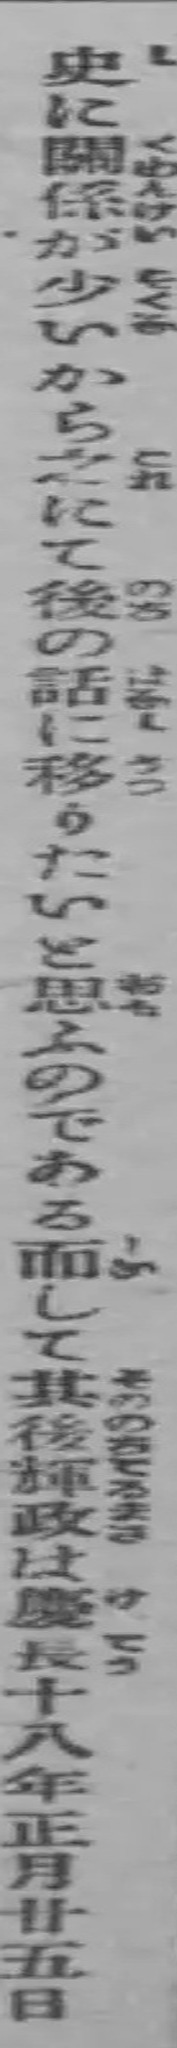史に関係が少いから之にて後の話に移りたいと思ふのである而して其後輝政は慶長十八年正月廿五日
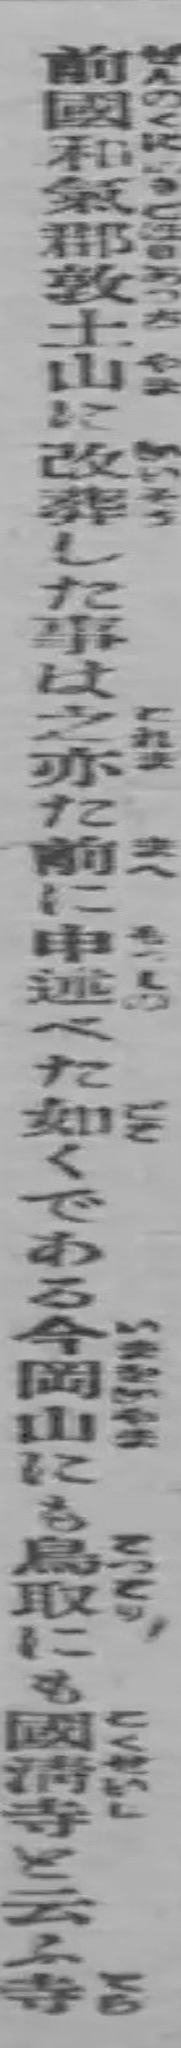前国和気郡敦土山に改葬した事は之亦た前に申述べた如くである今岡山にも鳥取にも国清寺と云ふ寺
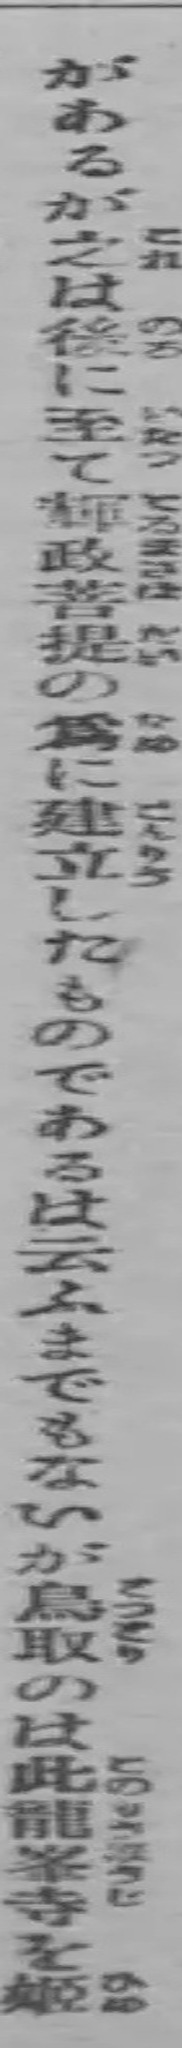国清寺があるが之は後に至て輝政菩提の為に建立したものであるは云ふまでもないが鳥取のは此龍峯寺を姫
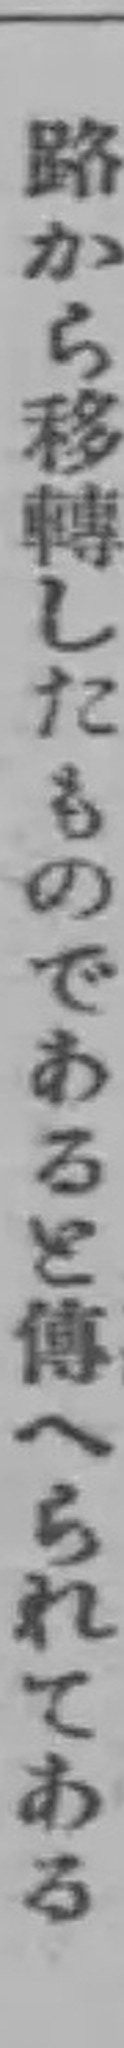路から移転したものであると伝へられてある
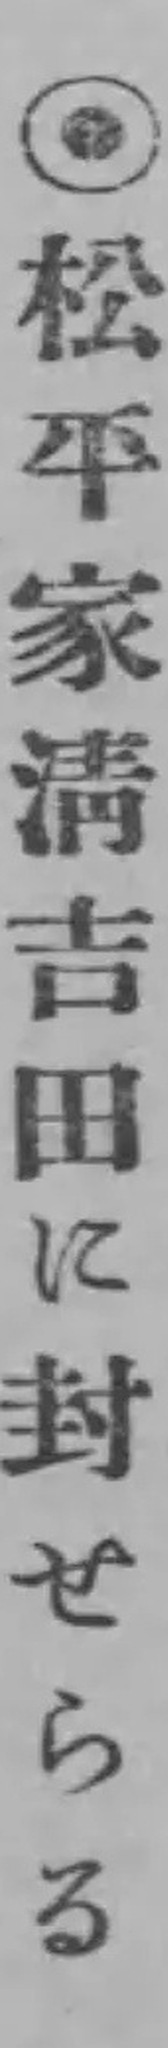⦿松平家清吉田に封せらる
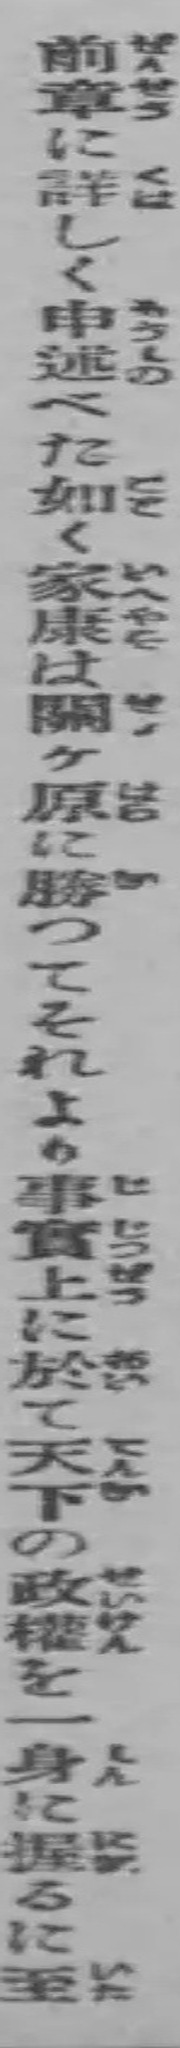前章に詳しく申述べた如く家康は関ヶ原に勝つてそれより事実上に於て天下の政権を一身に握るに至
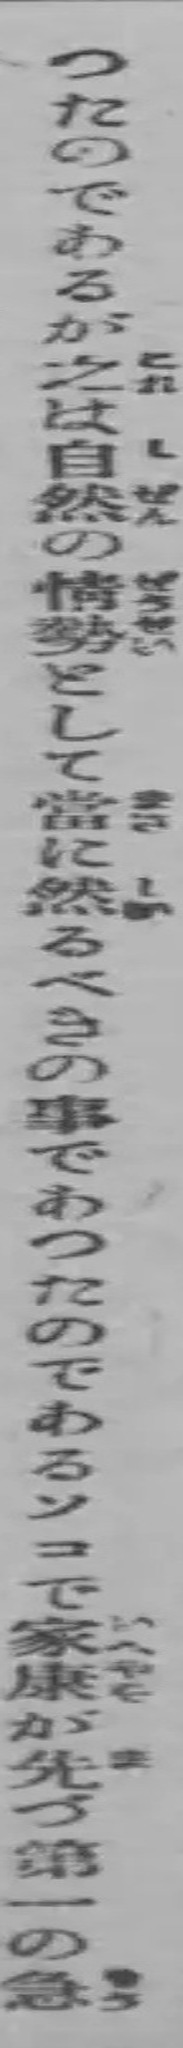つたのであるが之は自然の情勢として当に然るべきの事であつたのであるソコで家康が先づ第一の急
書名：豊橋市史談
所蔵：国立国会図書館 National Diet Library, JAPAN
